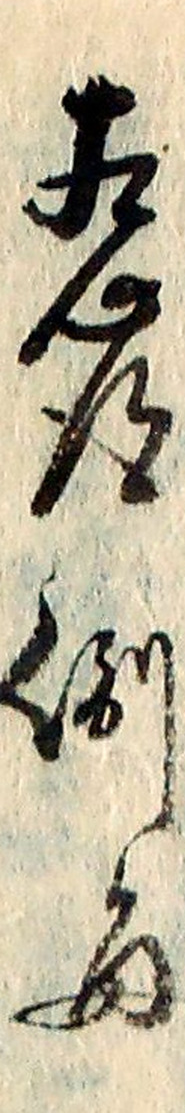相心得例毎
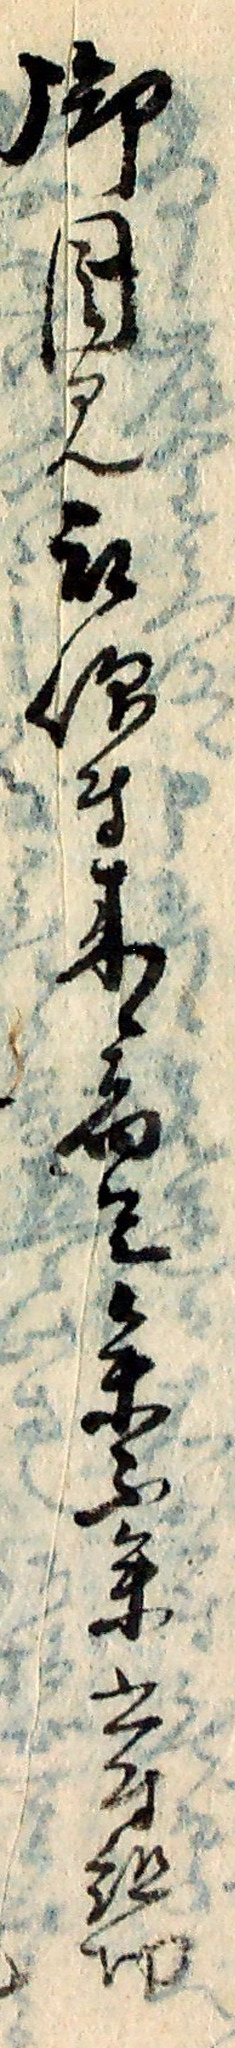御目見被仰付来候者共参不参書付組切
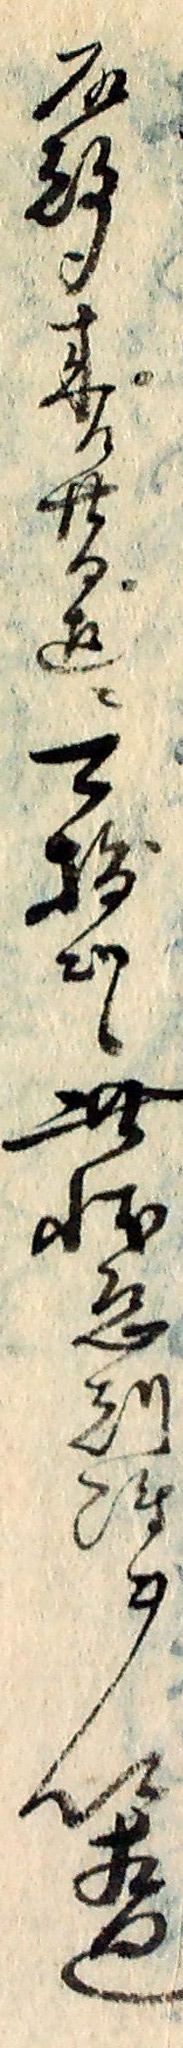取都め来る廿日迄に可指出候此状急刻附を以相廻
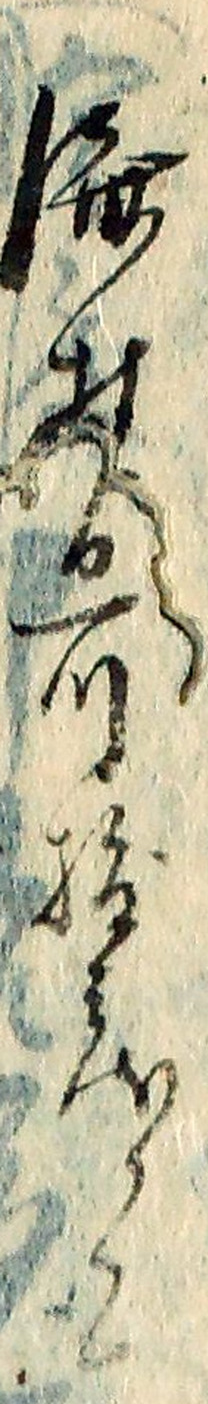済村ゟ可指戻候以上
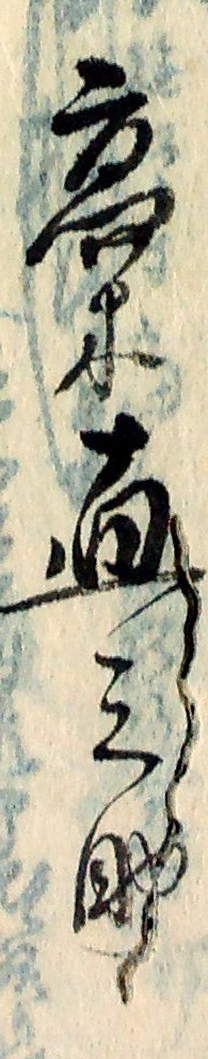高木真之助
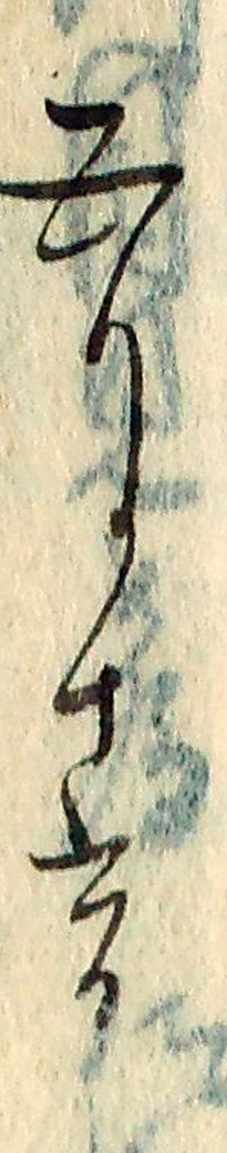五月十六日
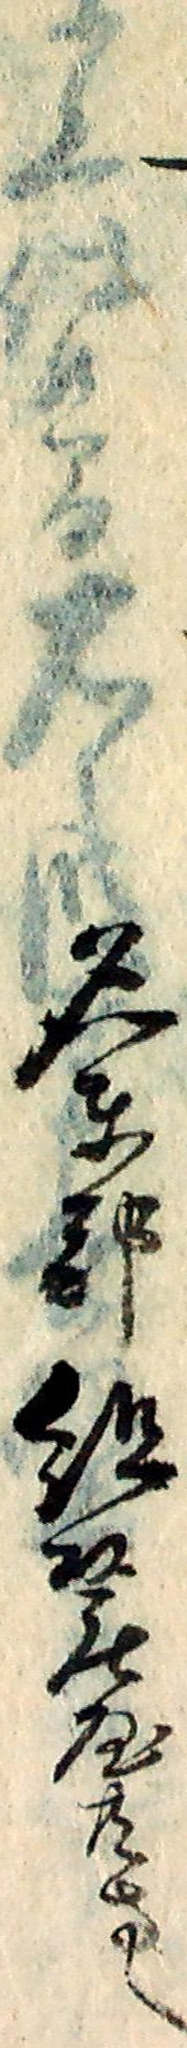名東郡組頭庄屋共方へ
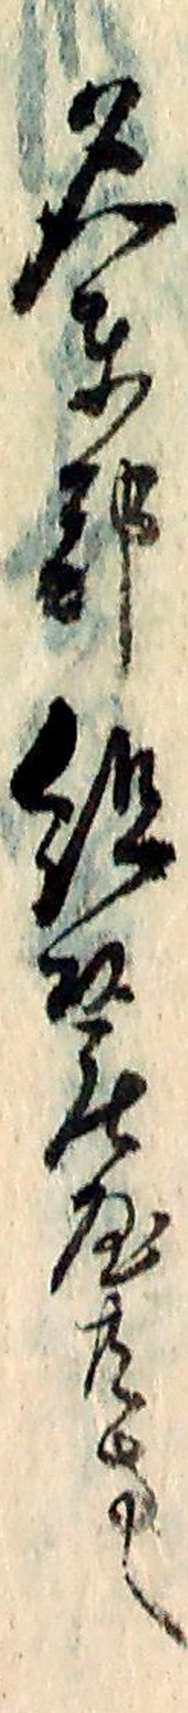名東郡組頭庄屋共方へ
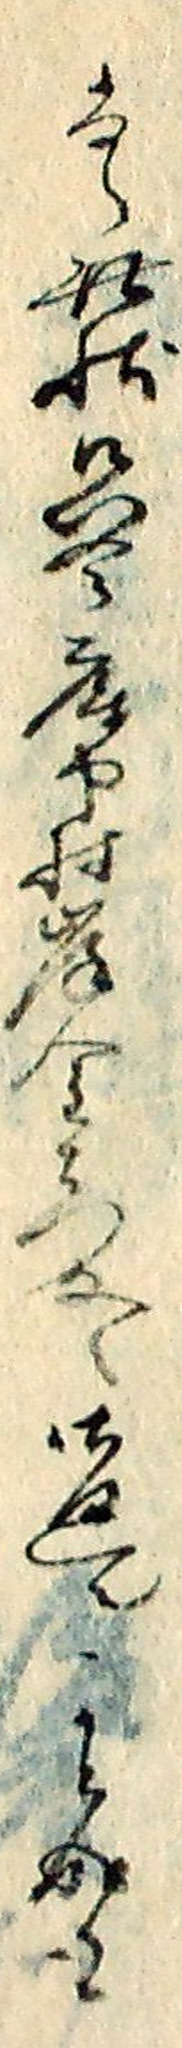尚々此状只今府中村岸金右衛門殿へ御廻し可被成候以上
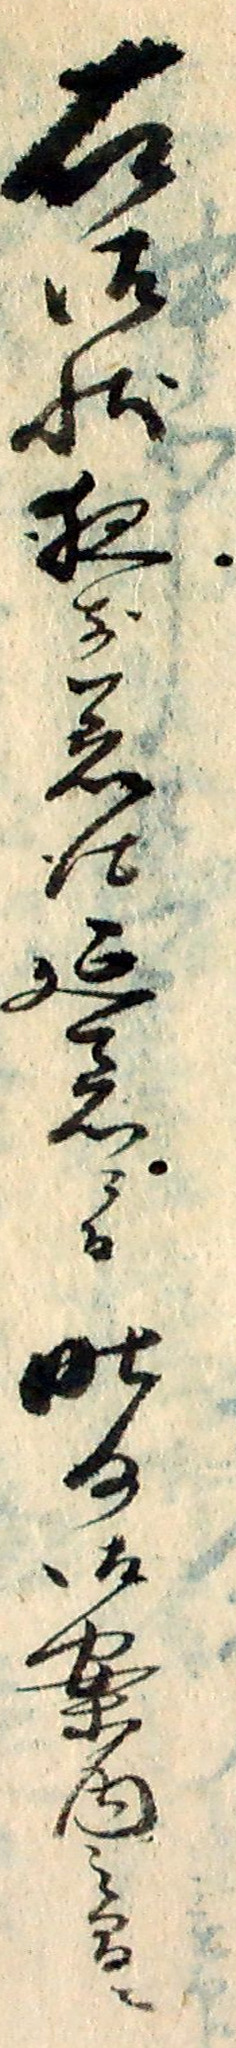右御状夜前着仕延着にて昨日御案内之間に
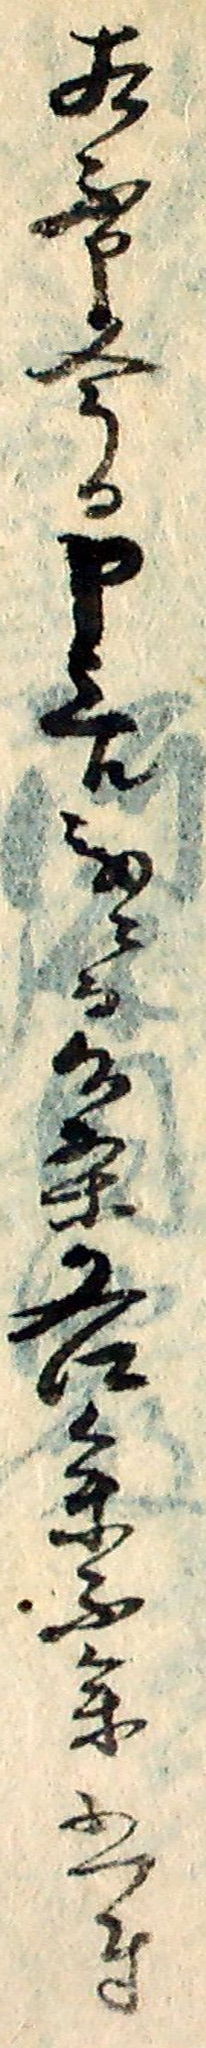相不申今日申上る義にて候条各参不参書付
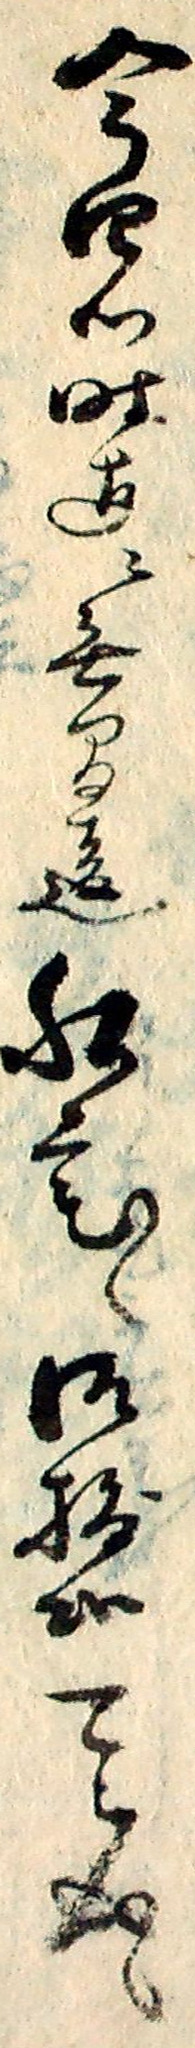今四つ時迄に無間違私宅へ御指出可被成候
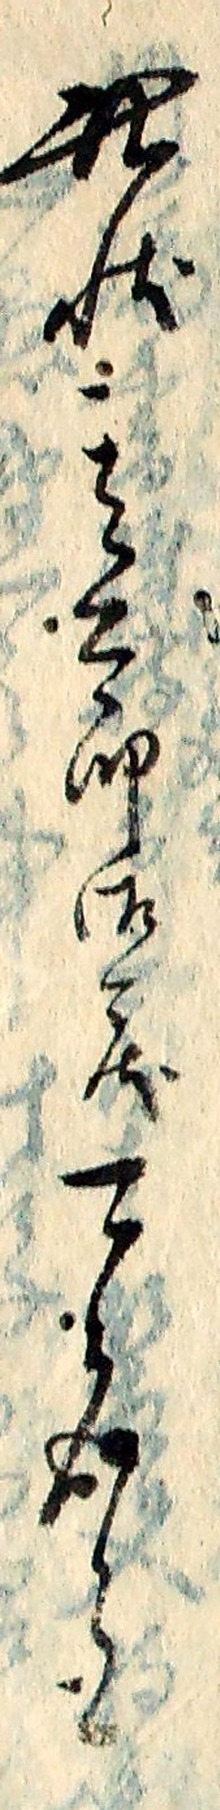此状其節御戻可被成候以上
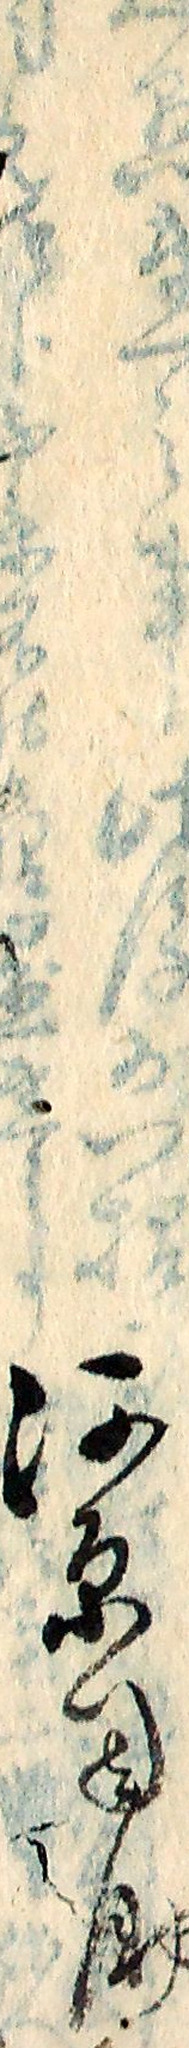河原周助
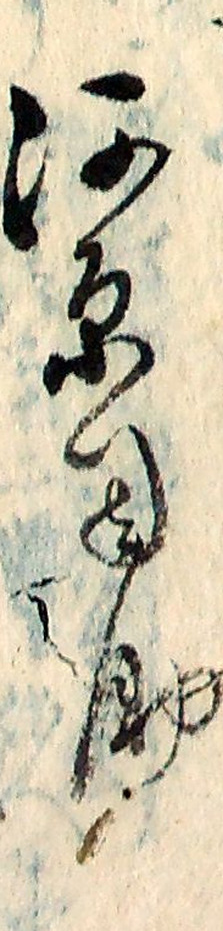河原周助
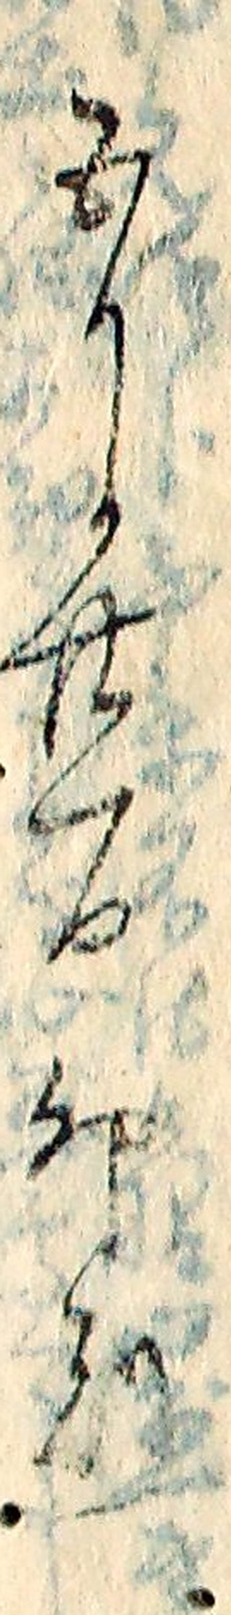五月廿一日卯刻
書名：諸御願書控(後藤氏壱番）
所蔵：鳴門教育大学 Naruto University of Education
